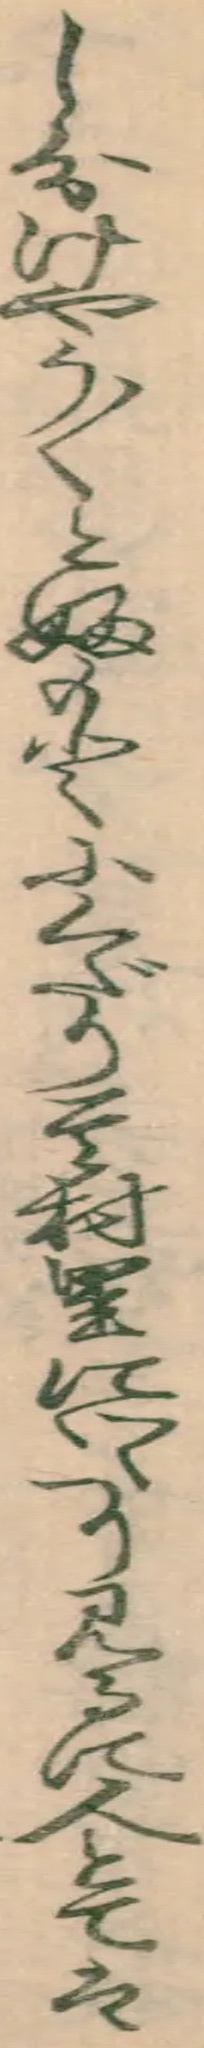し分けやう〳〵とふもとにくだり其村里にいたり見るに人とては
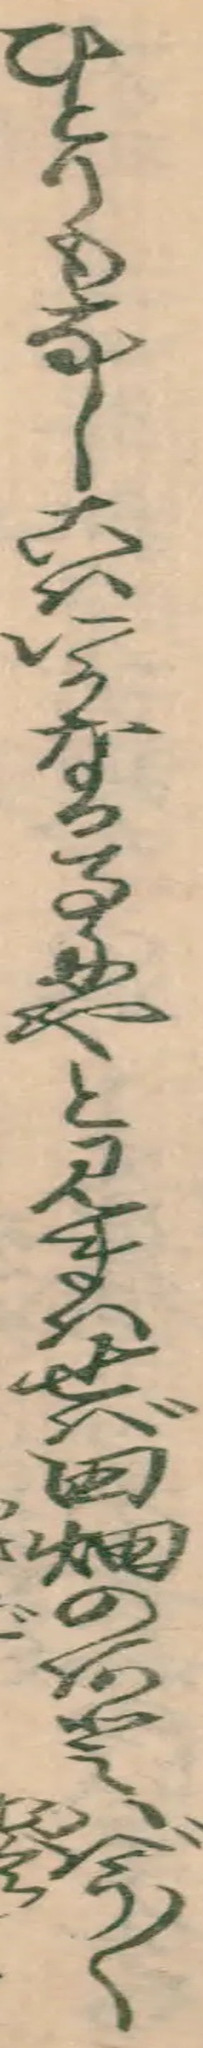ひとりもなしこはいかなる事にやと見まはせば田畑のあとはばう〳〵
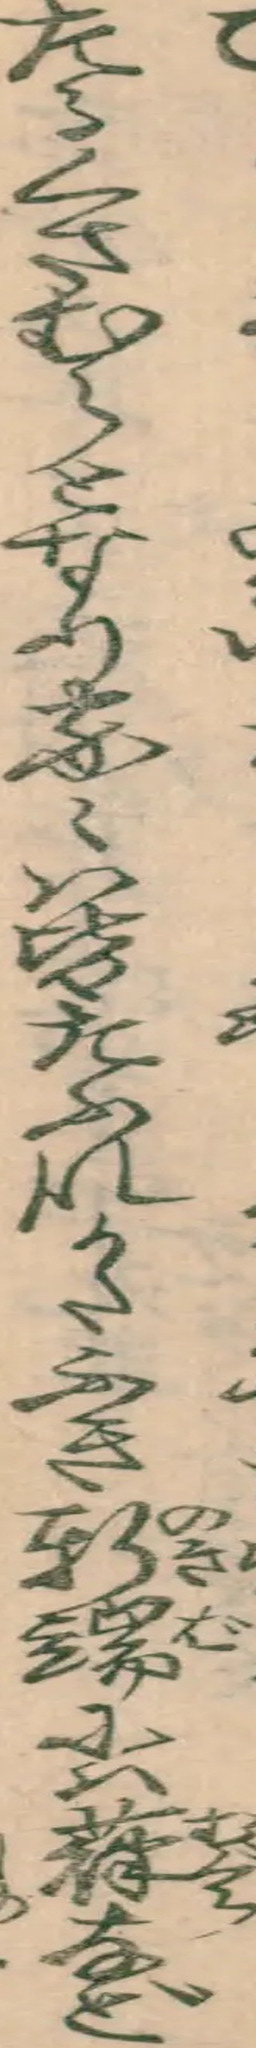たるくさむらとなり家々は皆たふれかたふき軒端には葎など
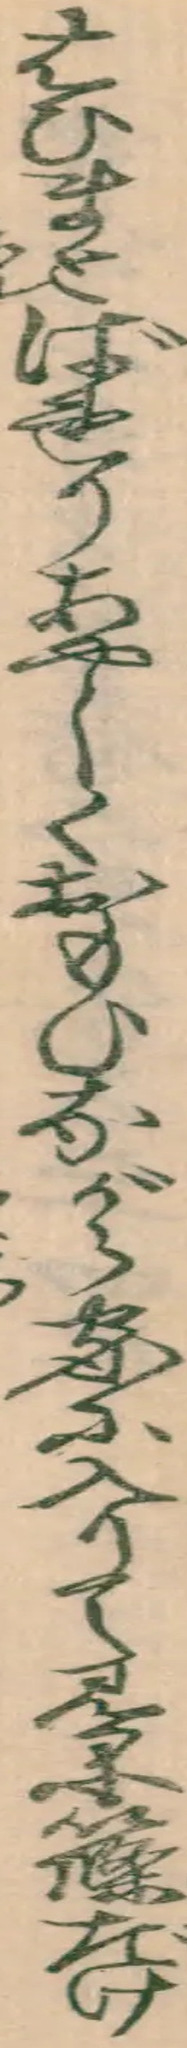はひまとばれりあやしくおもひながら家に入りて見るに篠だけ
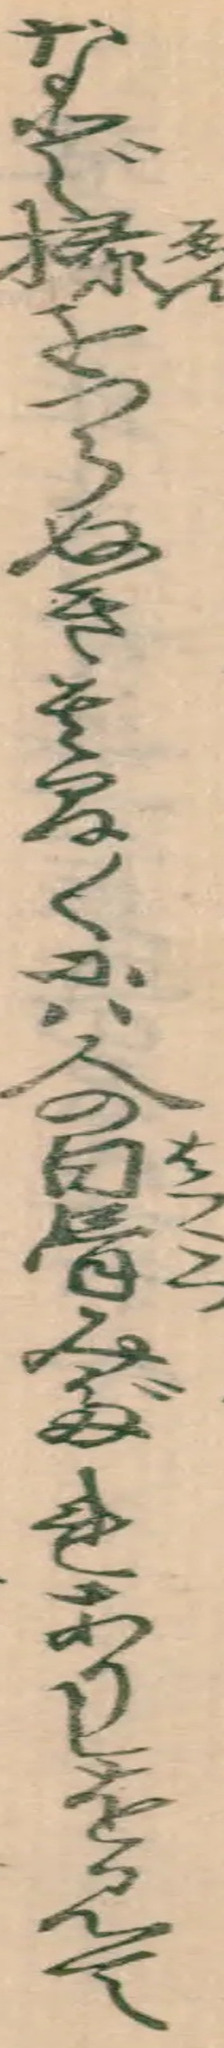など椽をつらぬき其間〳〵には人の白骨みだれありしを見て
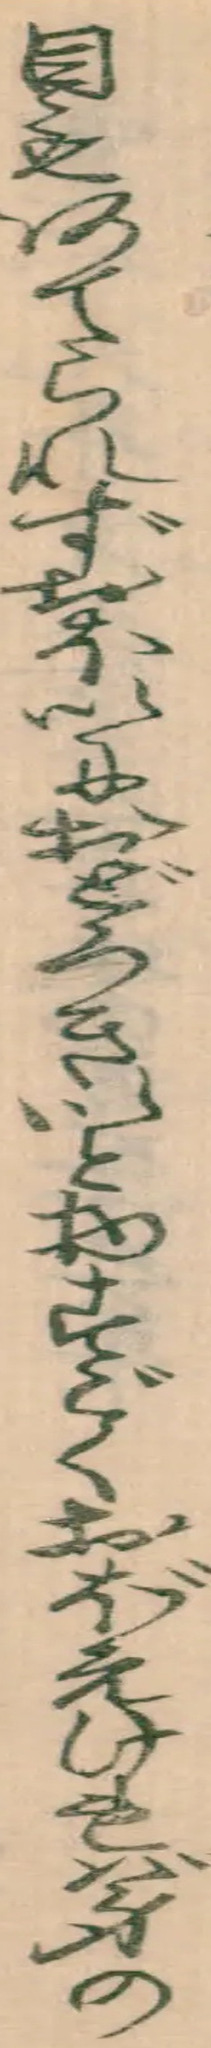目もあてられずおほいにおどろきいと物すごくおぼえければ身の
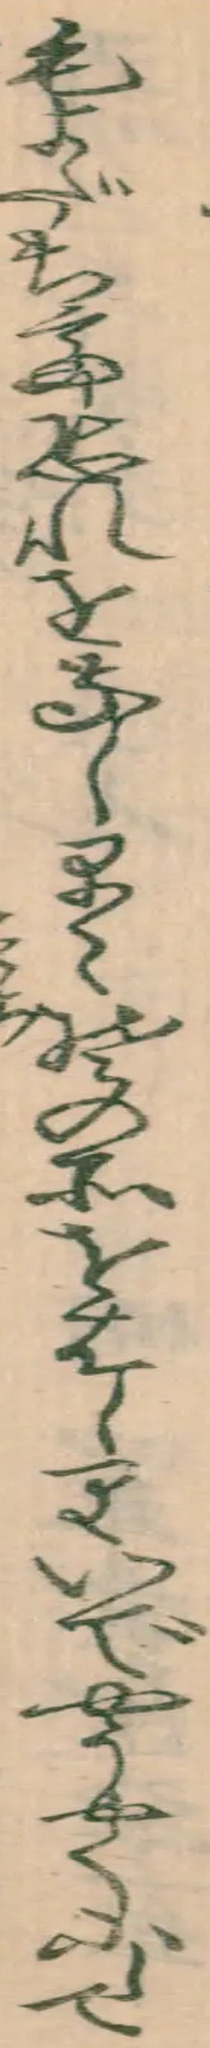毛よだちて恐れをなし早々その所をはしりいでやうやくにして
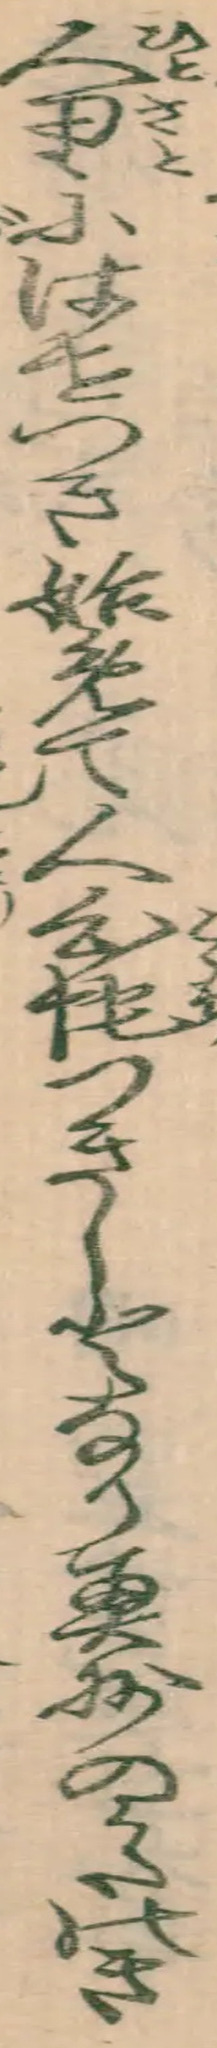人里にはせつき始めて人心地つきしとなり奧州のかたのき
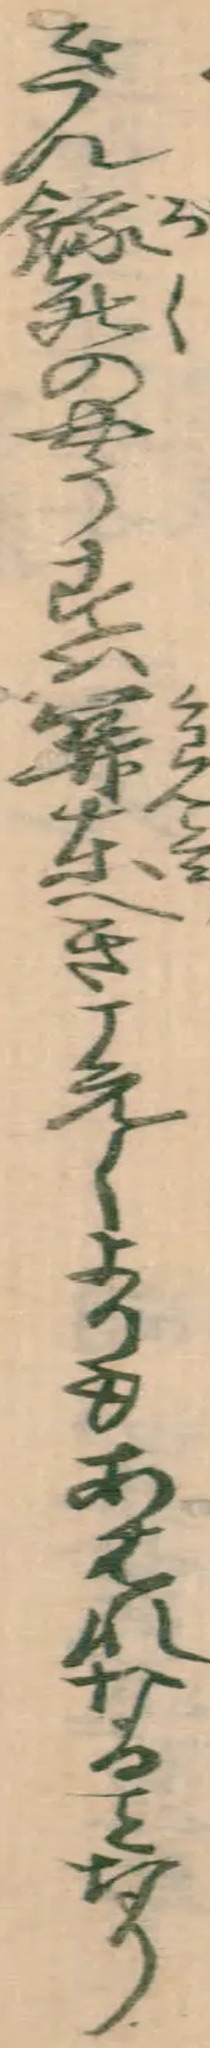きん餓死のやうすは関東へきこえしよりもあはれなることなり
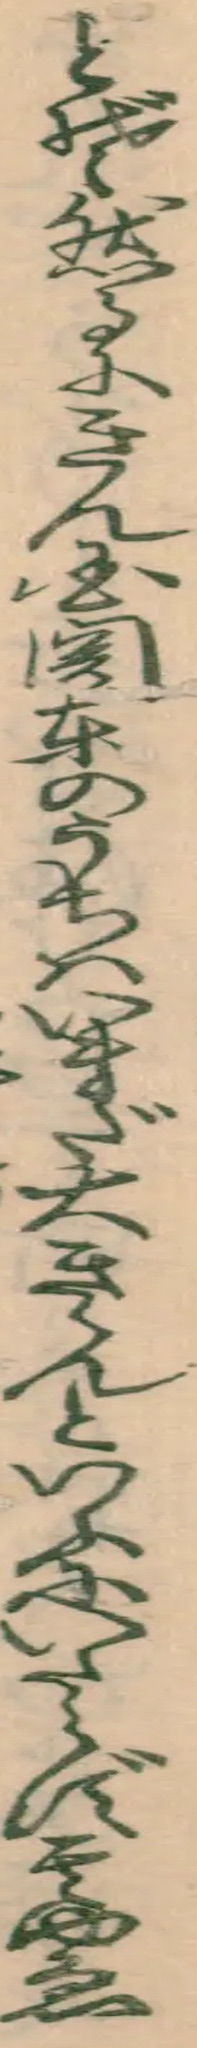とぞ然るにきん国関東のうちはいまだ大きゝんといふにいたらず其ゆゑ
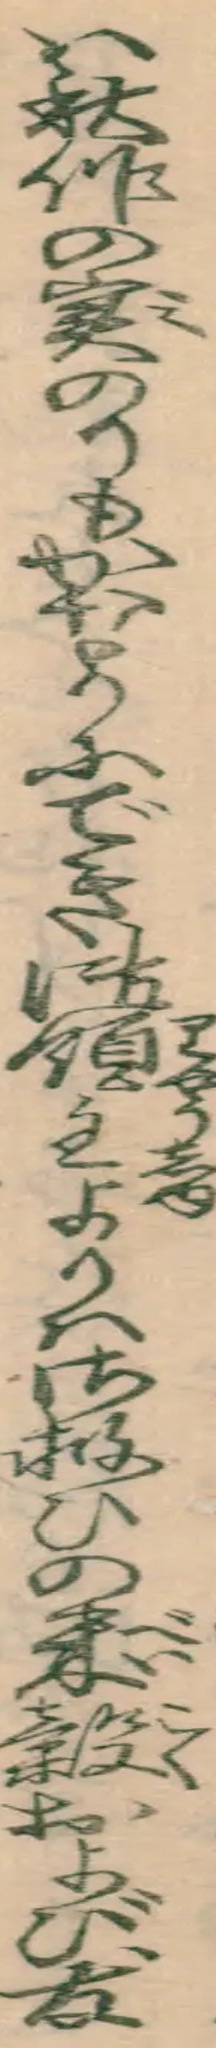は秋作の実のりもかなりにでき御領主よりは御救ひの米穀および友
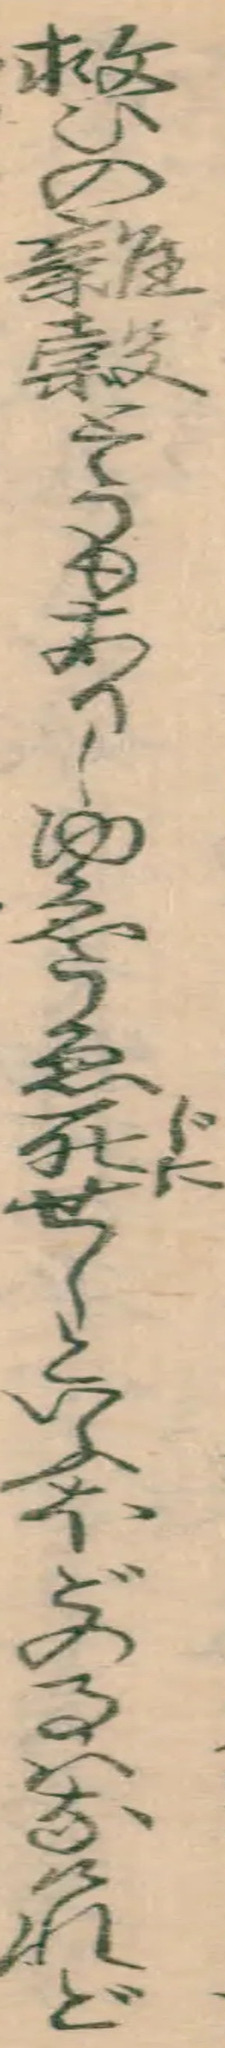救ひの雑穀とうもありしゆゑうゑ死せしといふほどの事はなけれど
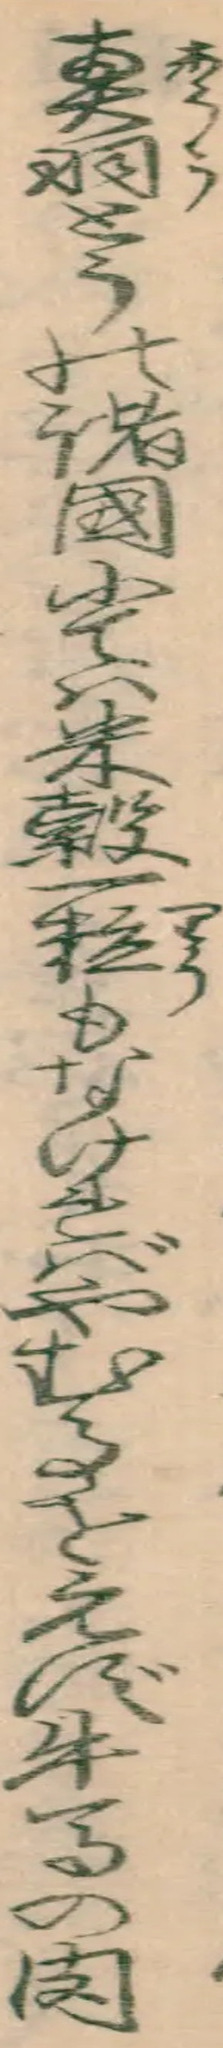奥羽とうの諸国にては米穀一粒もなければやむ事をえず牛馬の肉
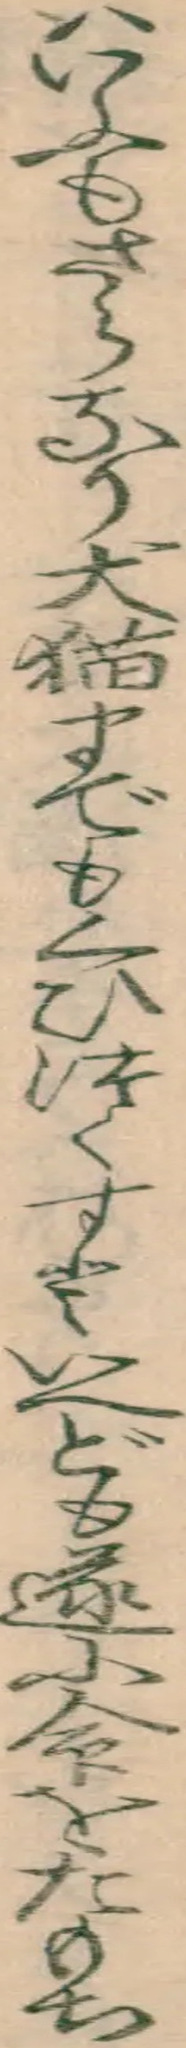はいふもさらなり犬猫までもくひつくすといへども遂に命をたもち
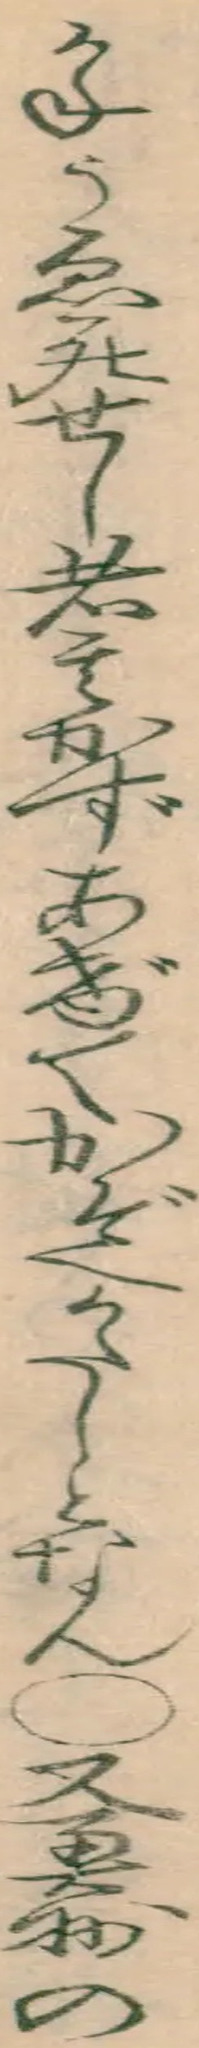かねうゑ死せし者其かずあげくかぞへかたしとなん○又奧州の
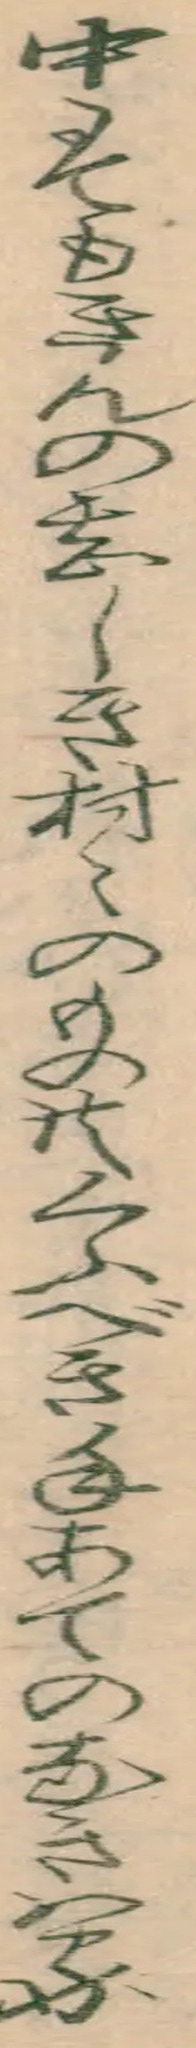中にてもきゝんの甚しき村々のもの共くふべき手あてのなきは家
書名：日ごとの心得
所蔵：国立国会図書館 National Diet Library, JAPAN
